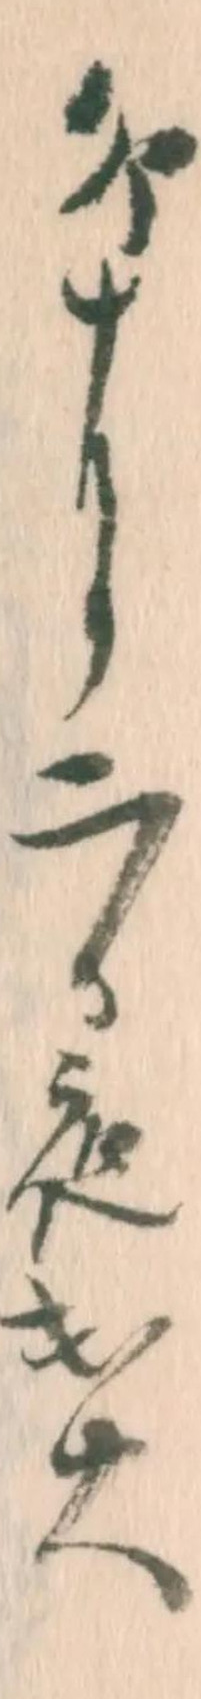卯十月二日夜出火
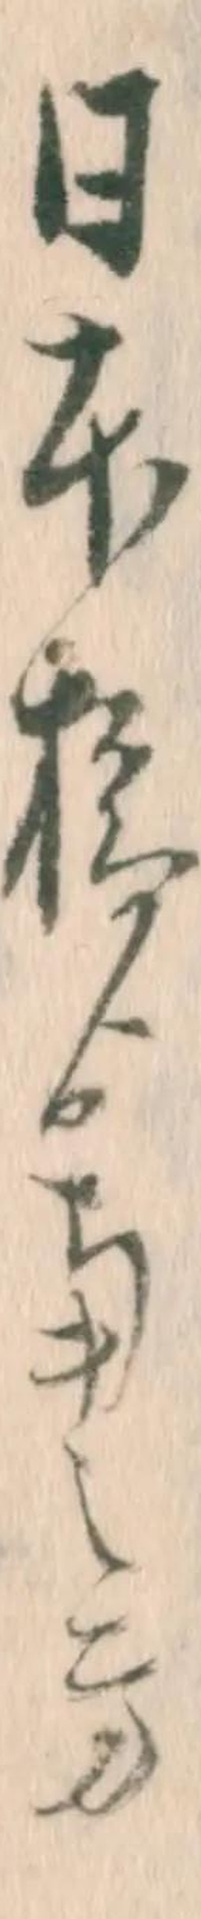日本橋ゟ南之方
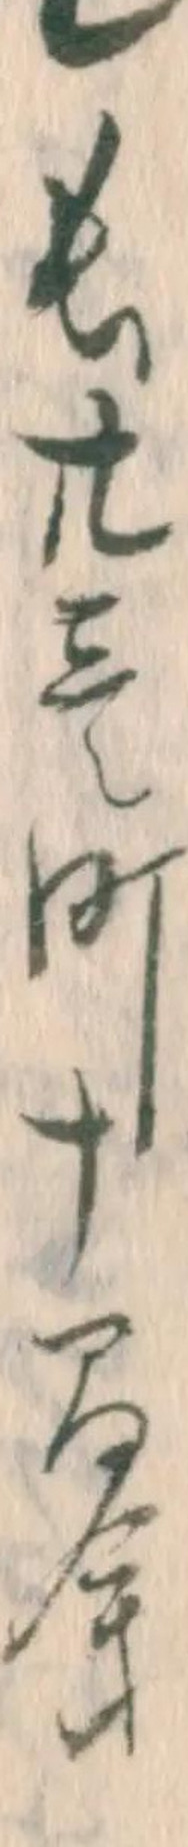凡長廿壱町十間余
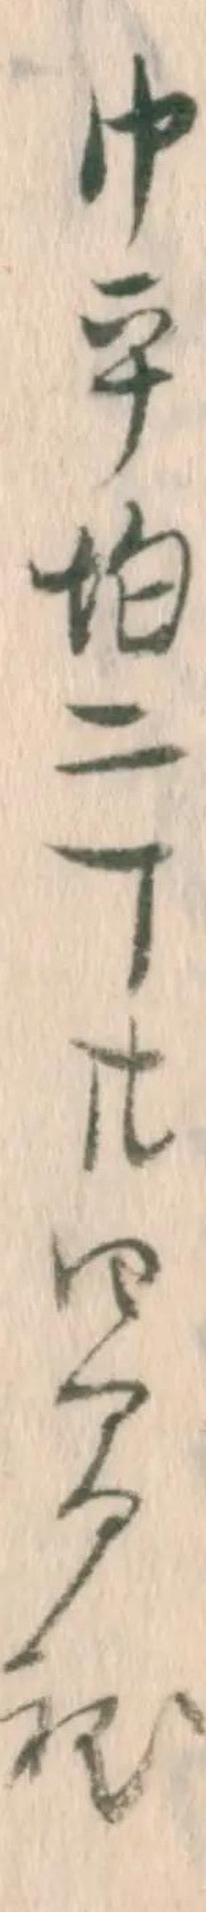巾平均二丁廿四間程
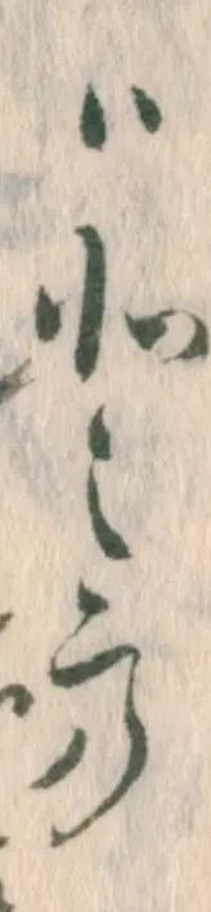同北之方
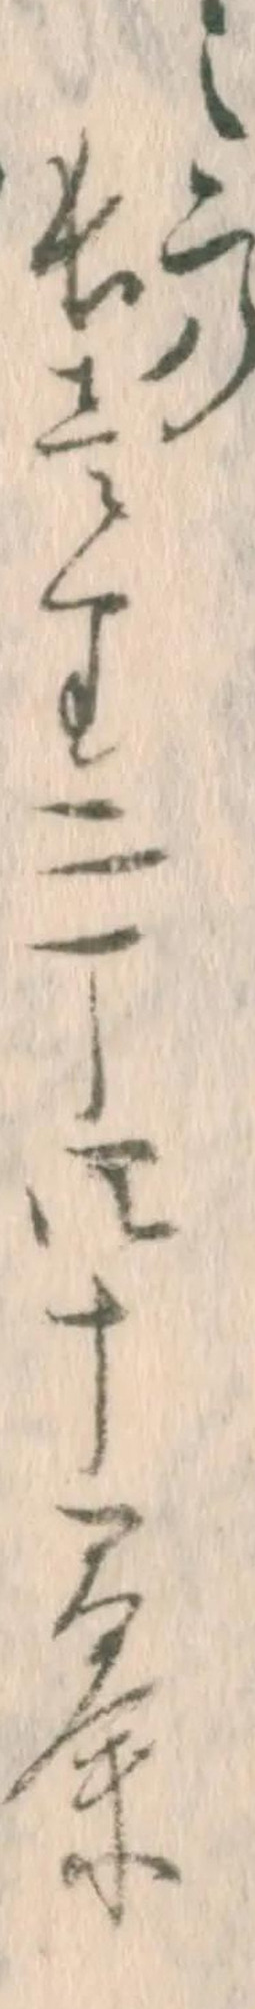凡長壱里二丁四十間余
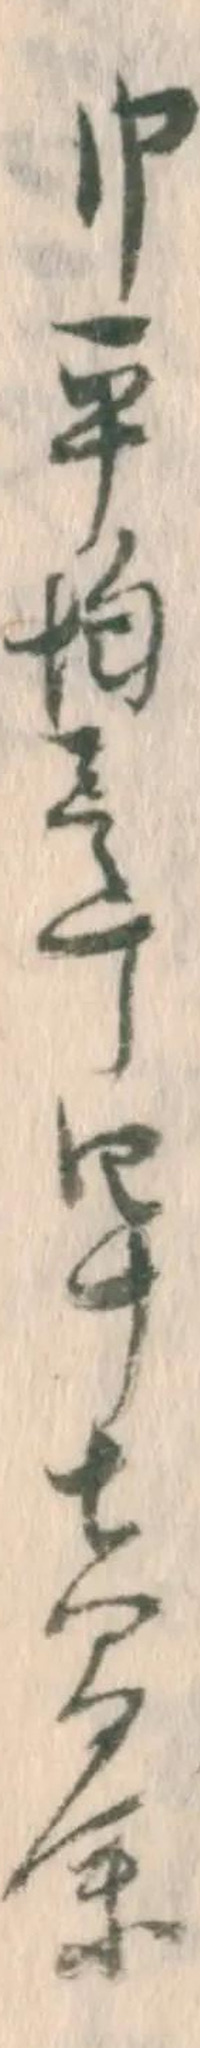巾平均壱丁四十七間余
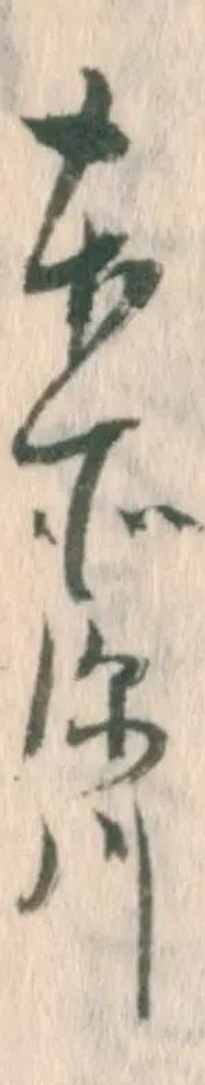本所深川
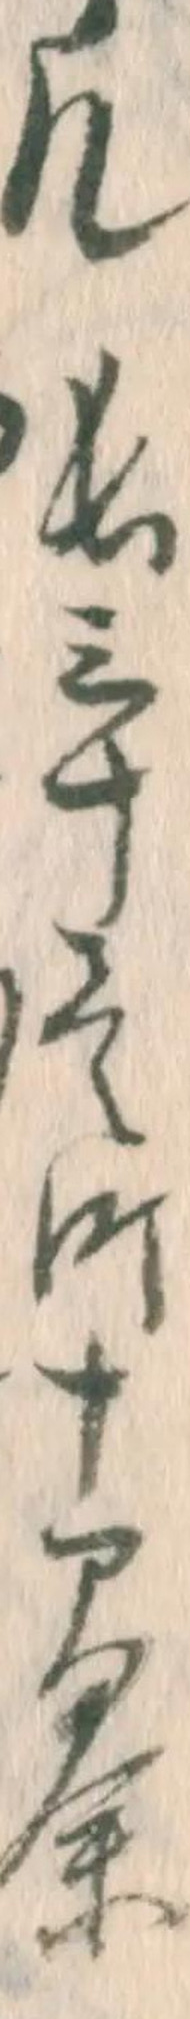凡長三十壱町十間余
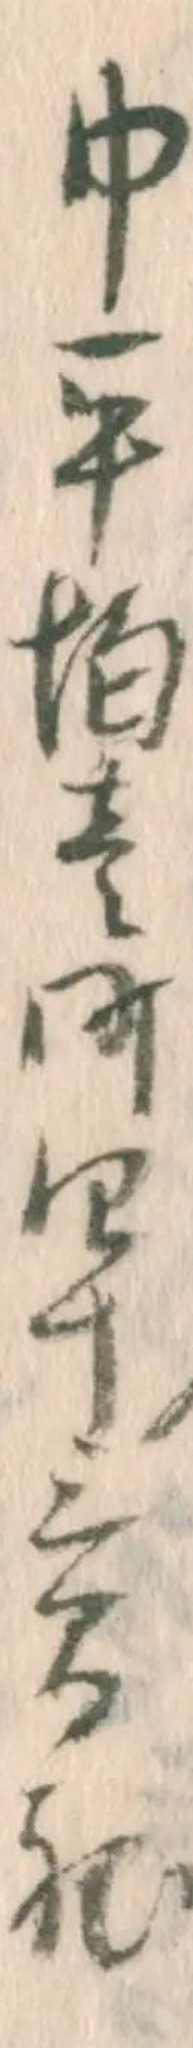巾平均壱町四十三間程
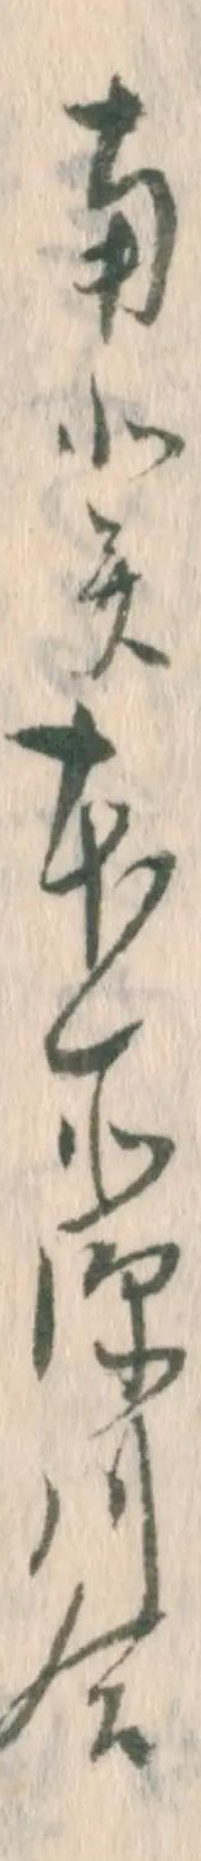南北并本所深川合
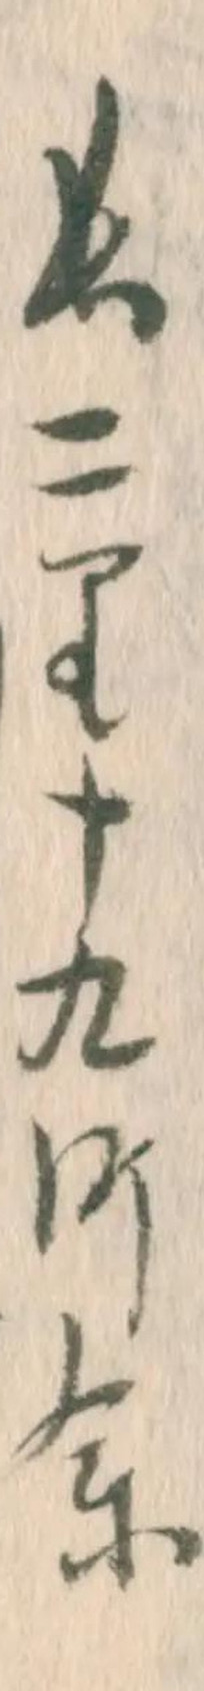凡長二里十九町余
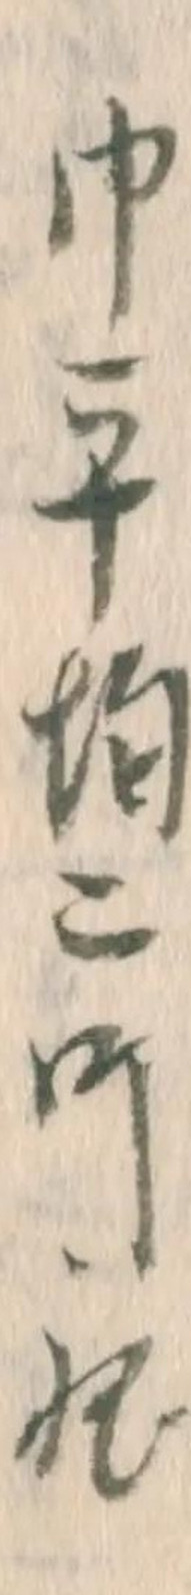巾平均二町程

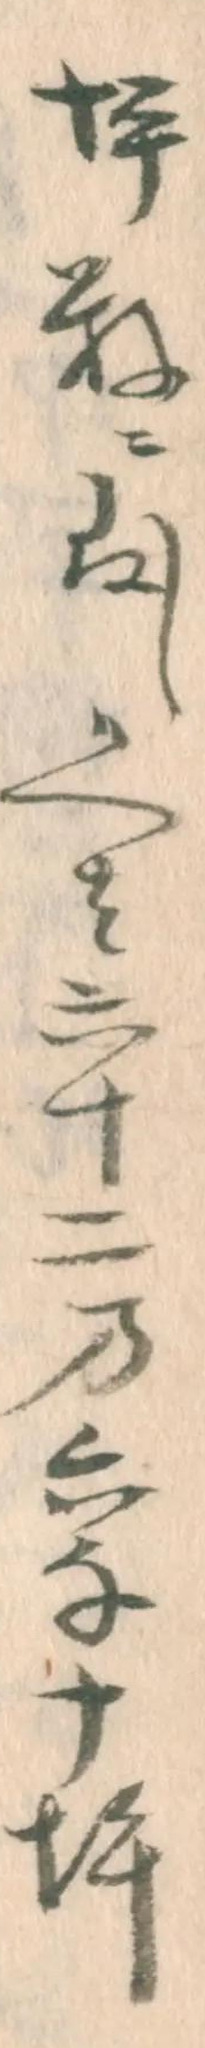坪数ニ致し候へは六十二万六千坪
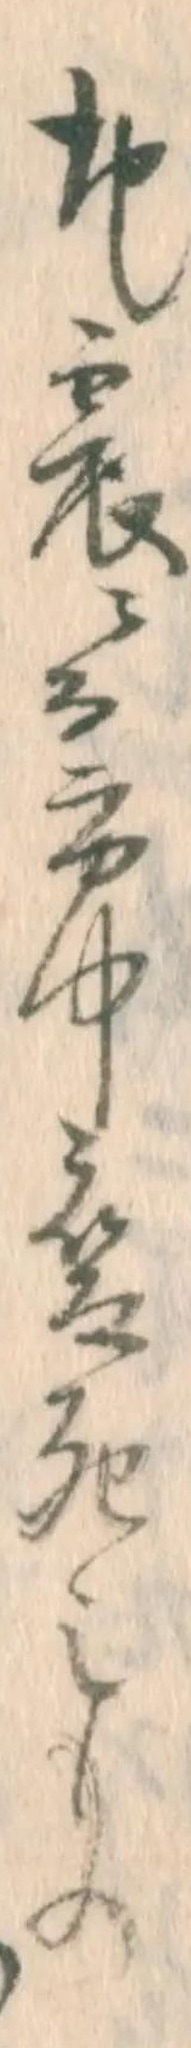地震ニ而市中変死之もの
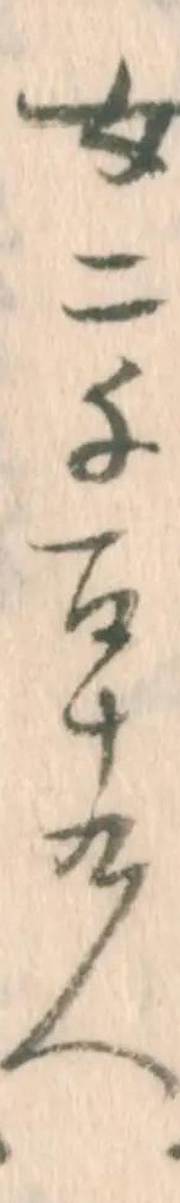女二千百十九人
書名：地震災書留 2巻. [1] 内表紙に「地震災書留　安政二卯年　但本所深川御用屋敷地代免除調」とあり
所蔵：国立国会図書館 National Diet Library, JAPAN
